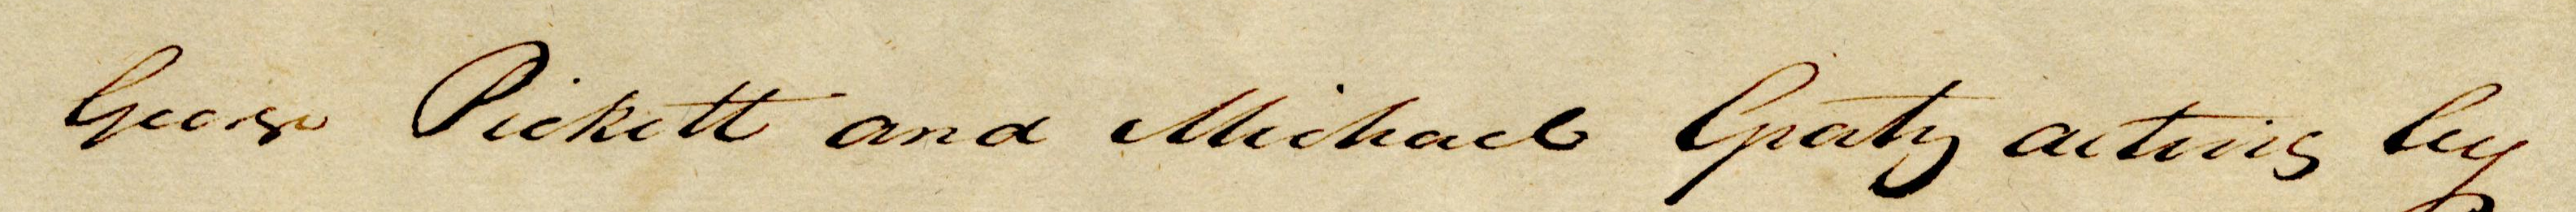George Pickett and Michael Gratz acting by
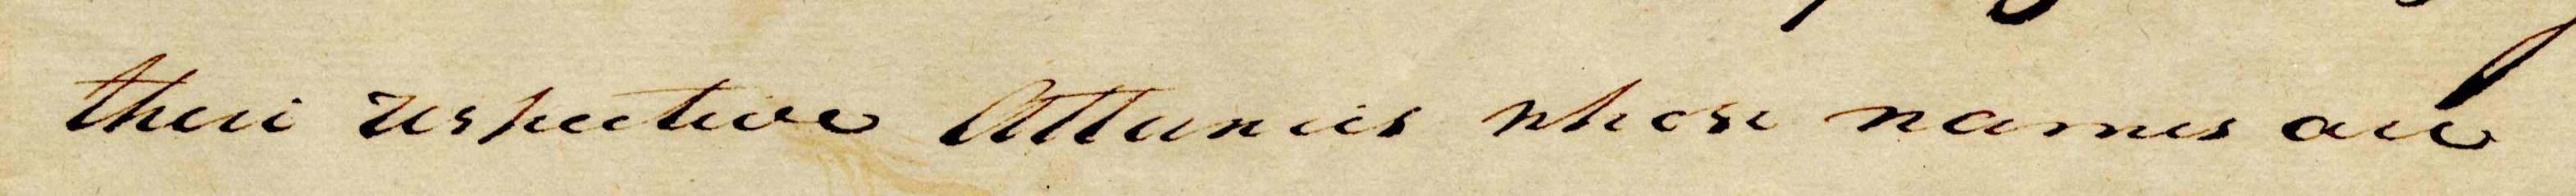their respective Attunies whose names are
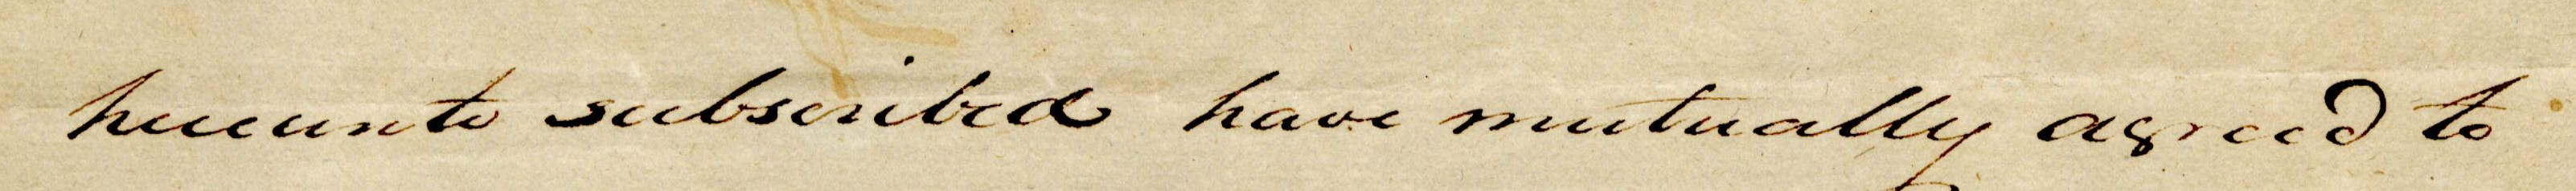hereunto subscribed have mutually agreed to
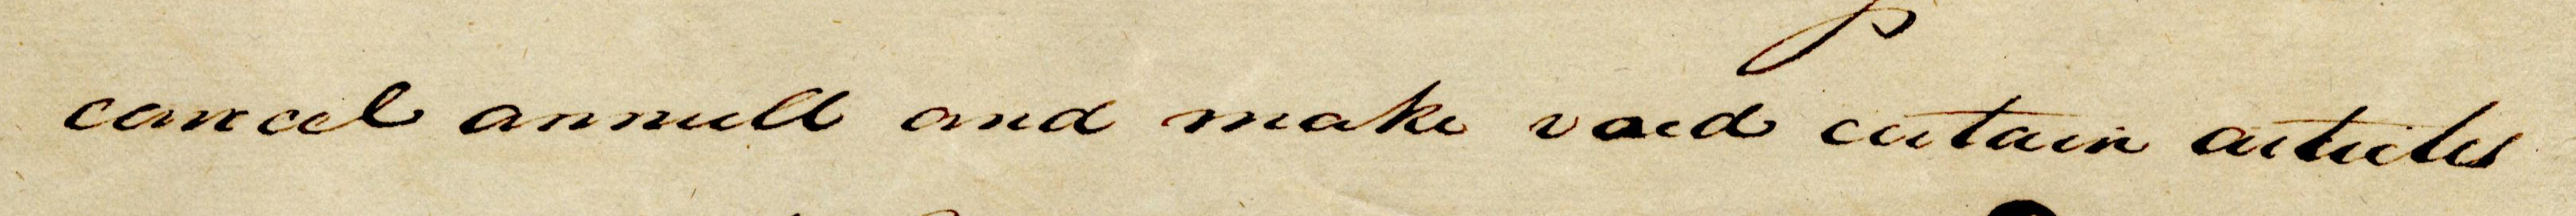cancel annull and make void certain articles
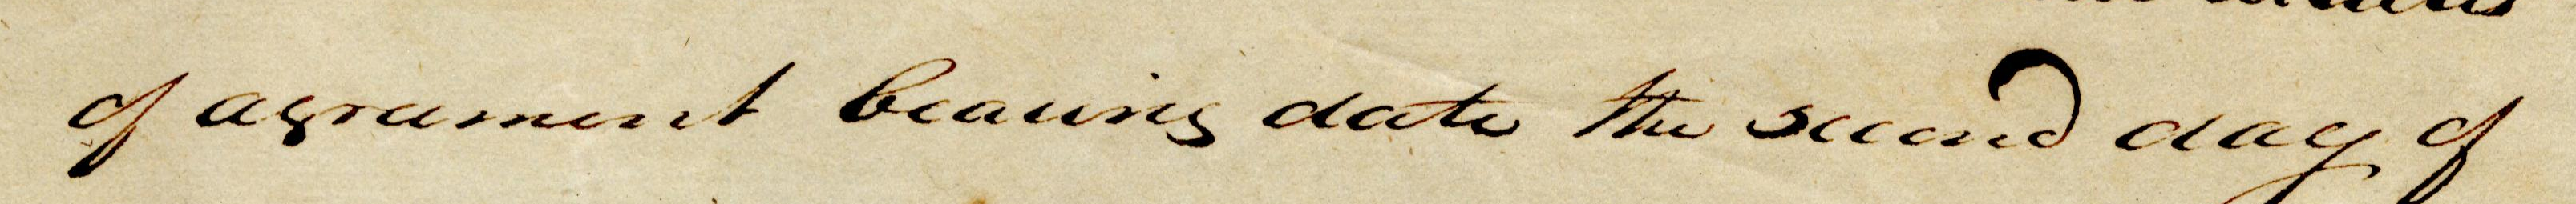of agreement bearing date the second day of
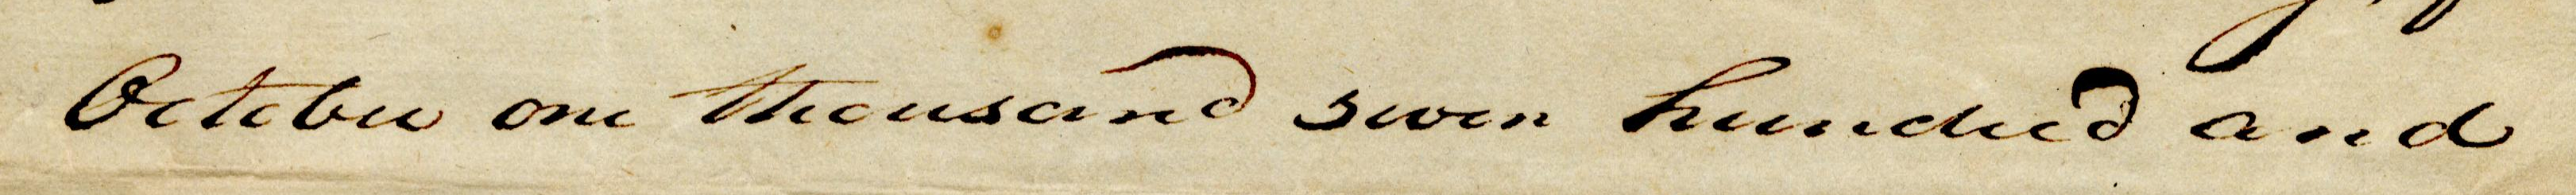October One Thousand seven hundred and
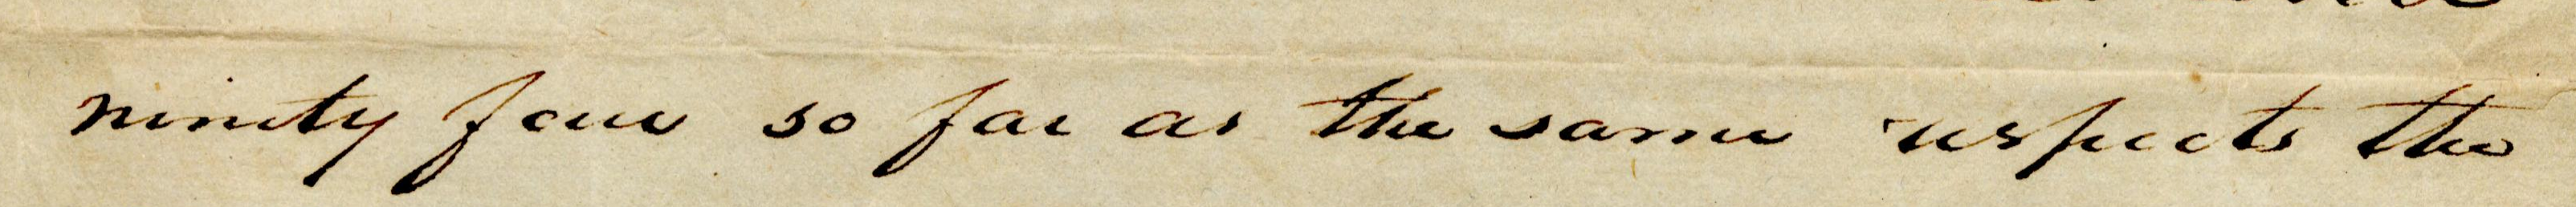ninety four so far as the same suspects the
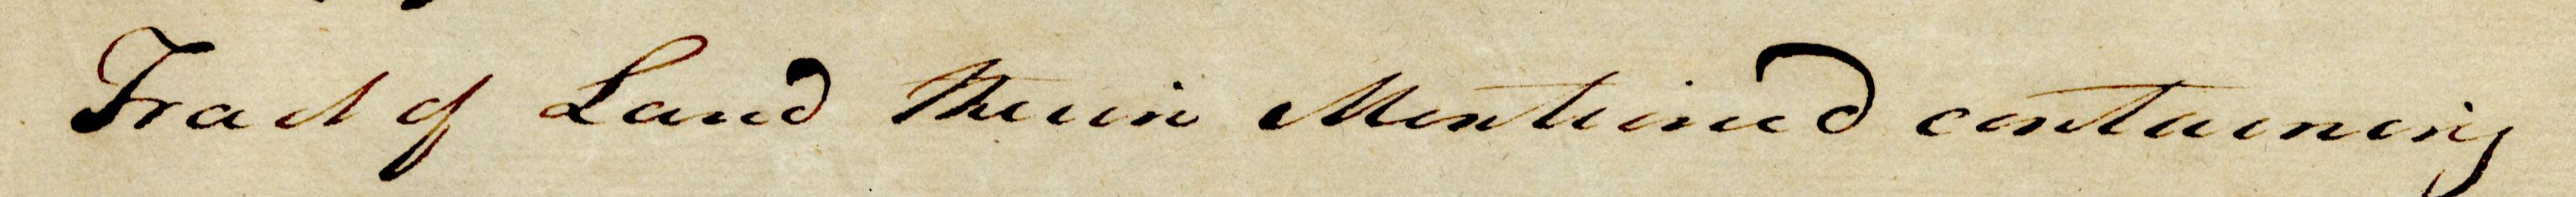Tract of Land therein Mentioned containing
